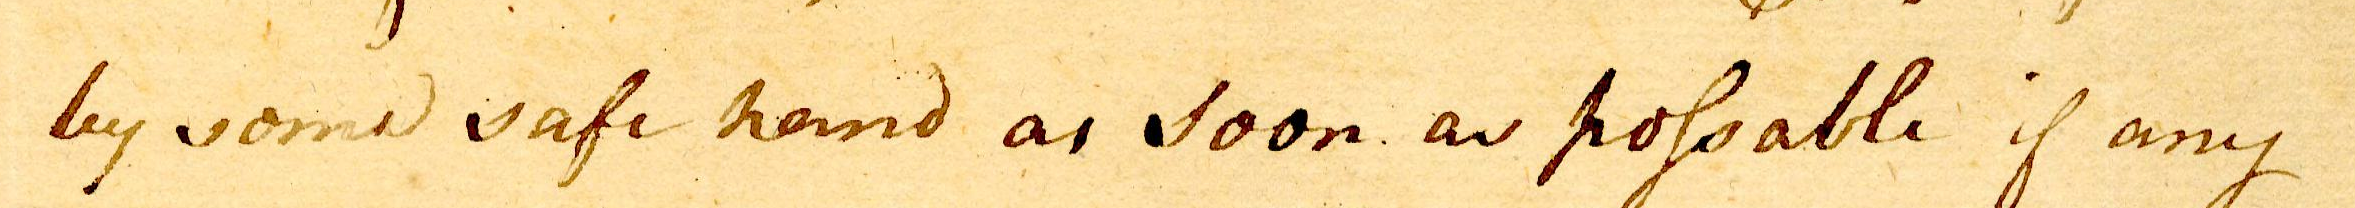by some safe hand as soon as possable if any
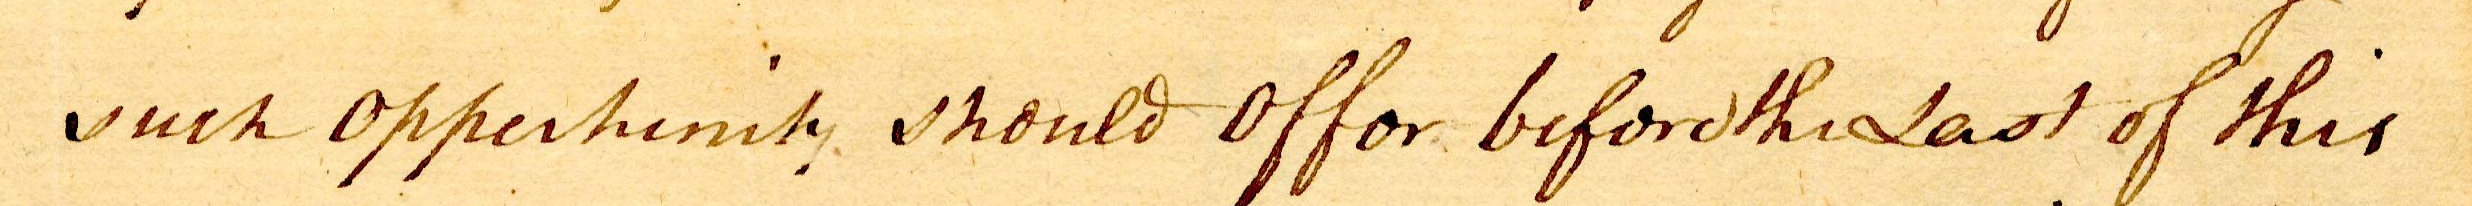such Oppertunity should Offor before the Last of this
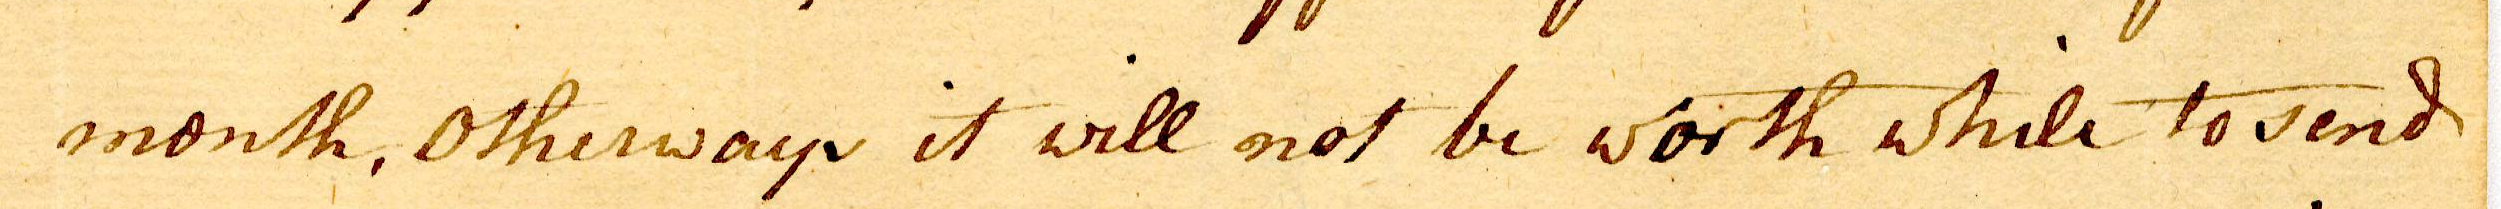month, Otherways it will not be worth while to send
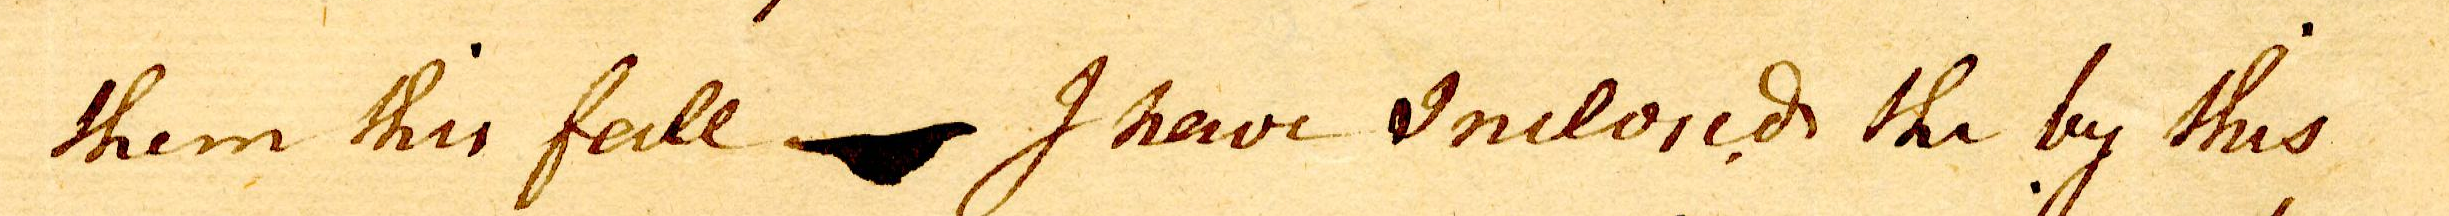them this fall- I have Inclosed the by this
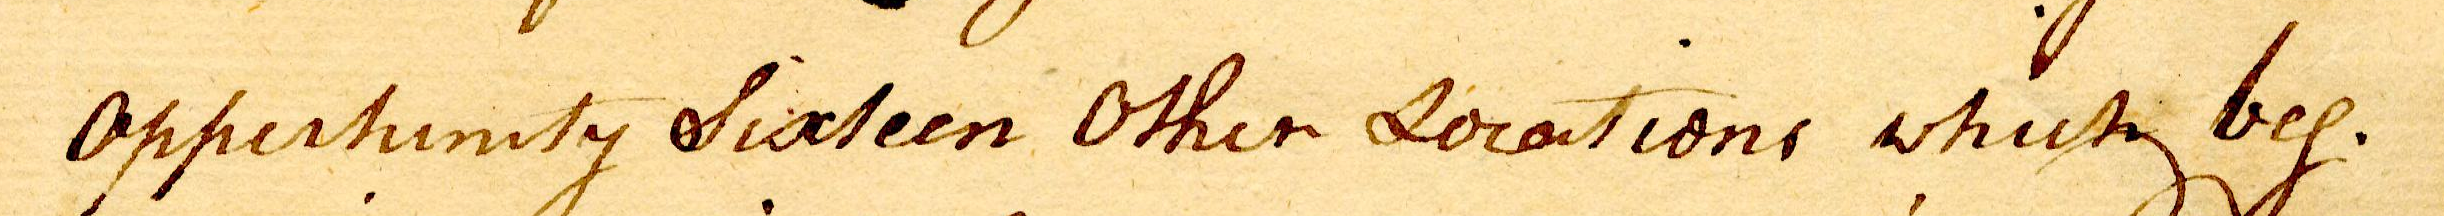oppertunity Sixteen Other Locations which beg.
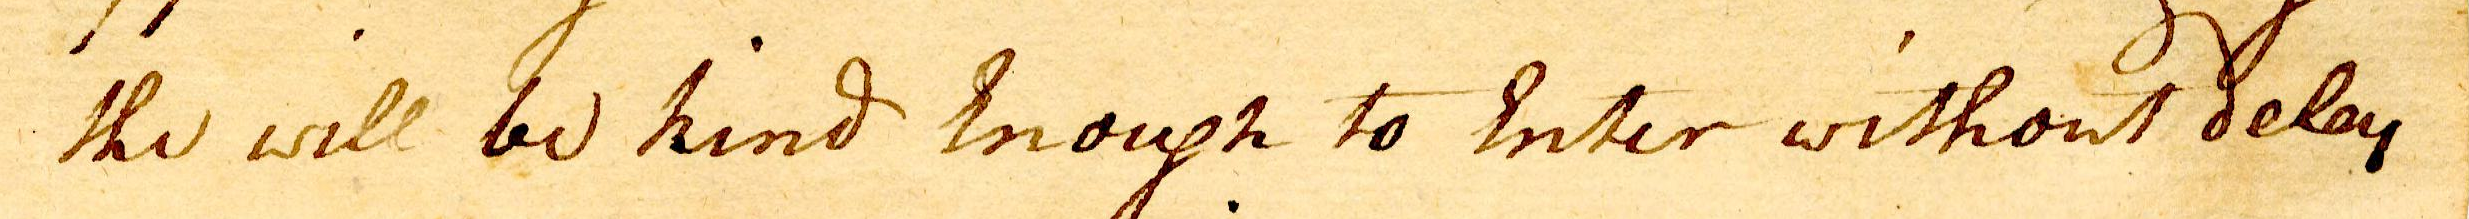the will be kind Enough to Enter without delay
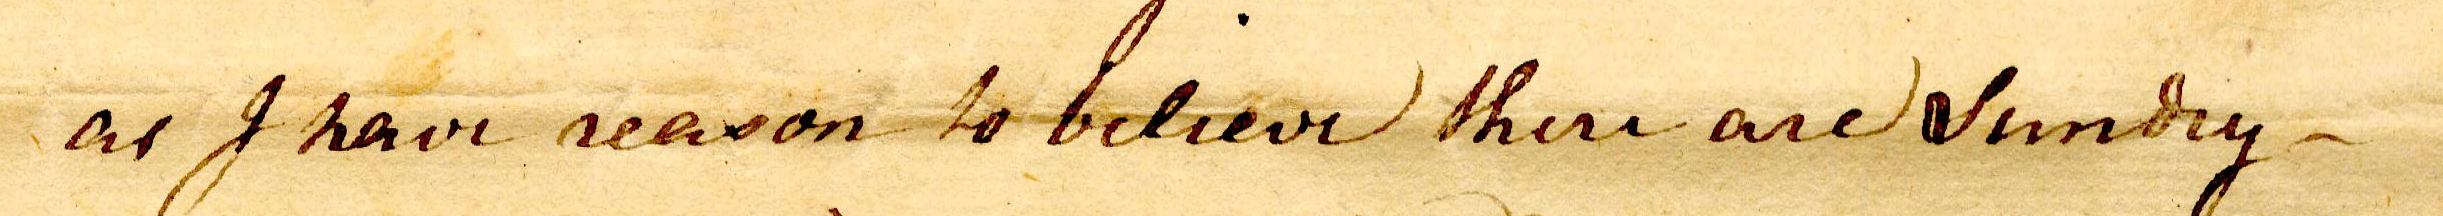as I have reason to believe there are sundry-
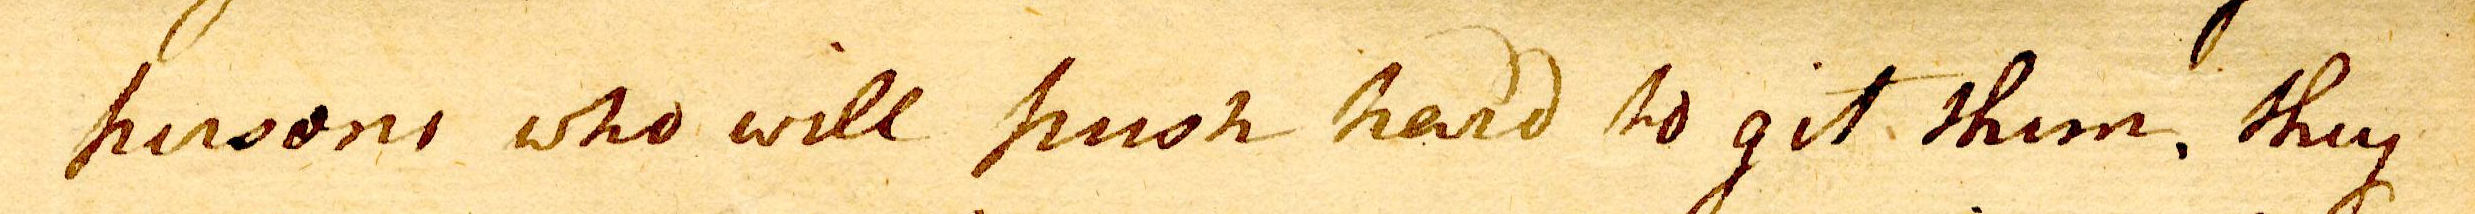persons who will push hard to git them. they
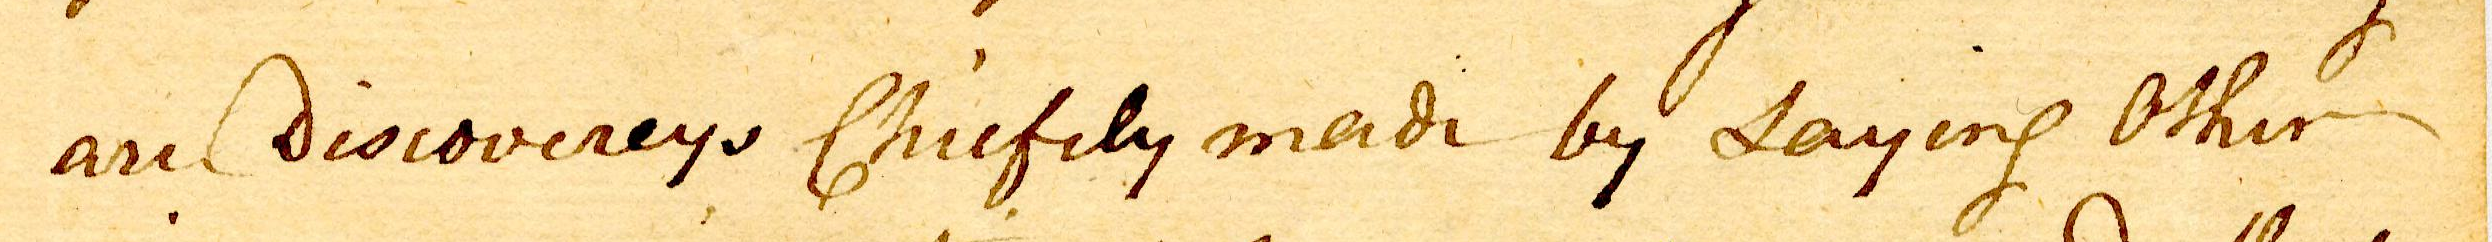are discoverys Chiefly made by Laying Other
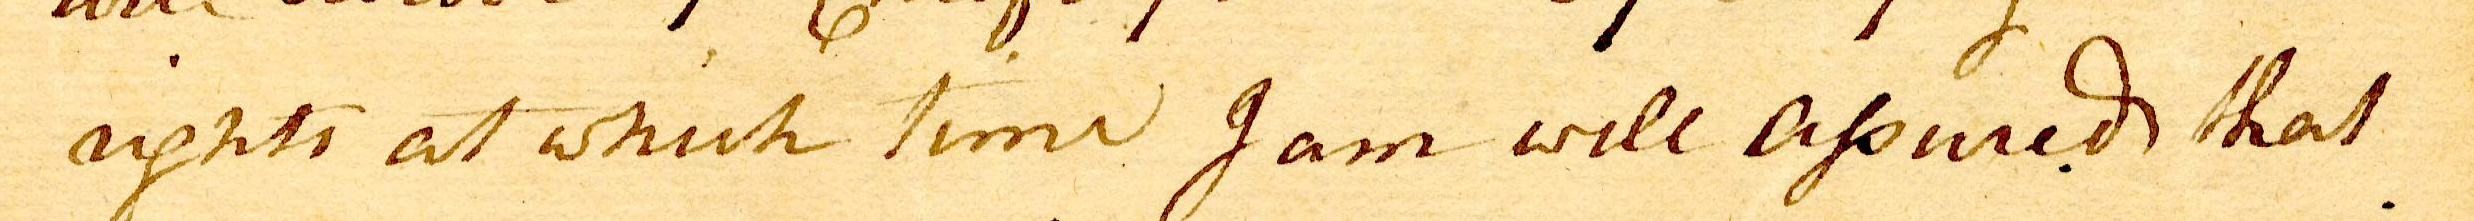rights at which time I am well assured that
